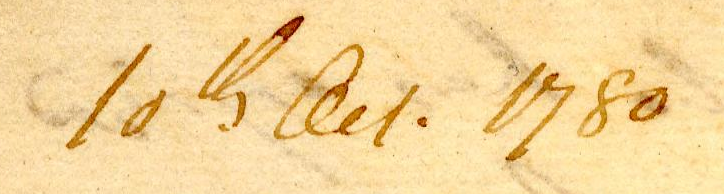10^th. Oct. 1780
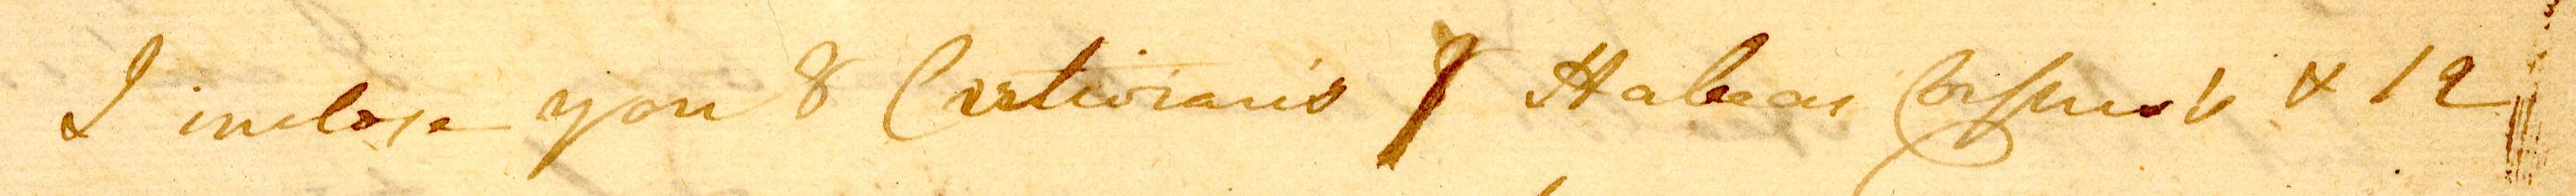I inclose you 8 Certioraris / Habeas Corpuses & 12
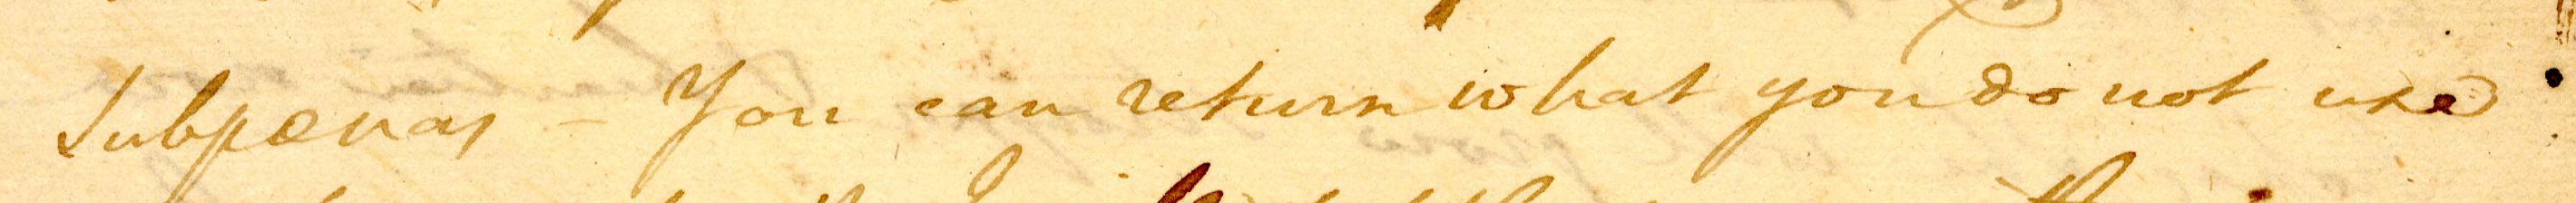Subponas. You can return what you do not use
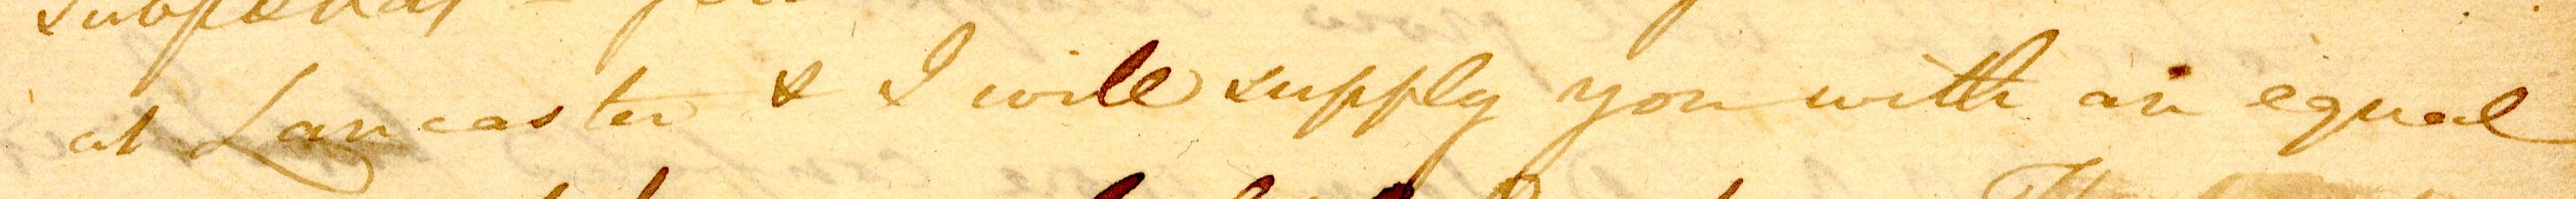at Lancaster & I will supply you with an equal
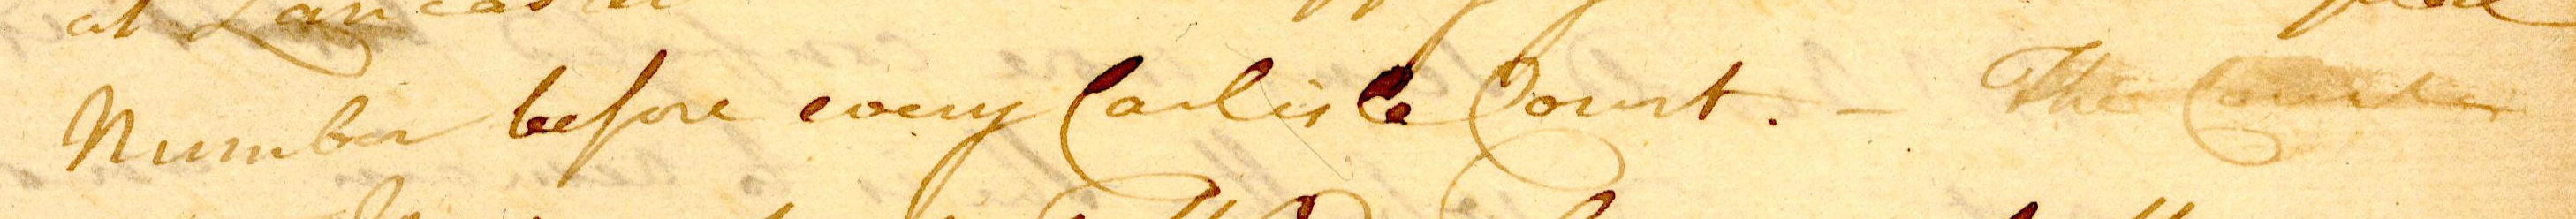Number before every Carlisle Court. The Court
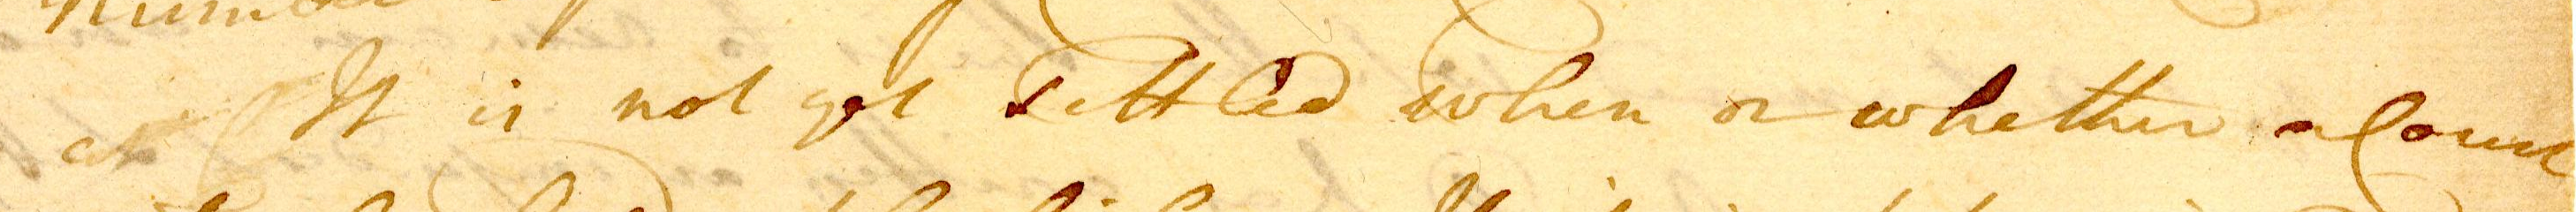lt is not yet settled when or whether a Court
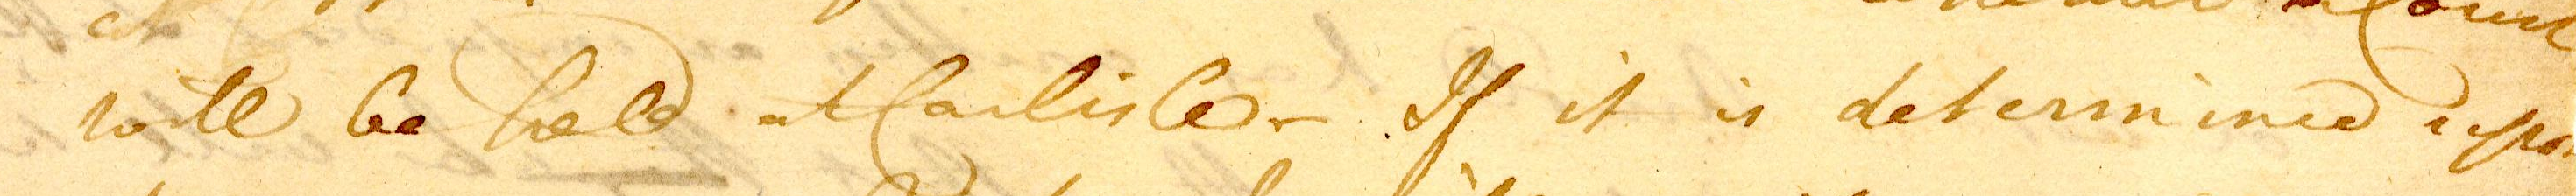will be held at Carlisle. If it is determined upon
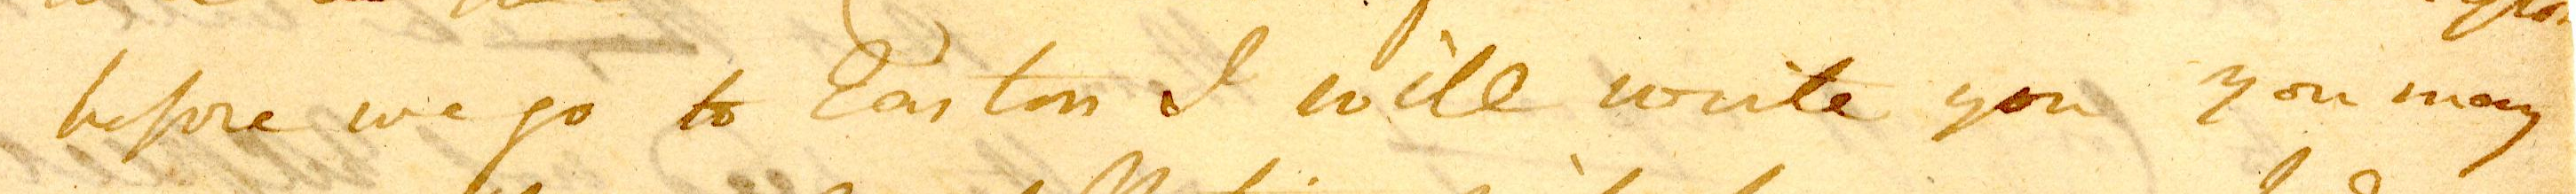before we go to Easton I will write you you may
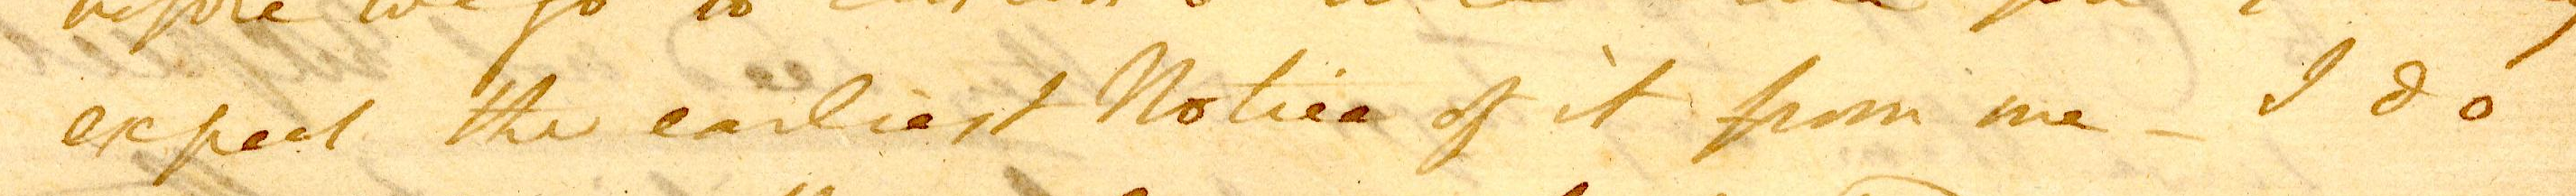expect the earliest Notice of it from me I do
